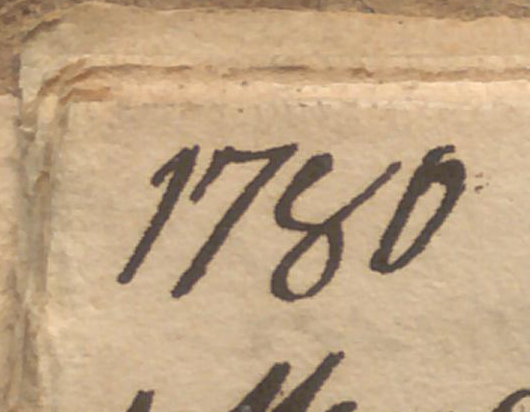1780
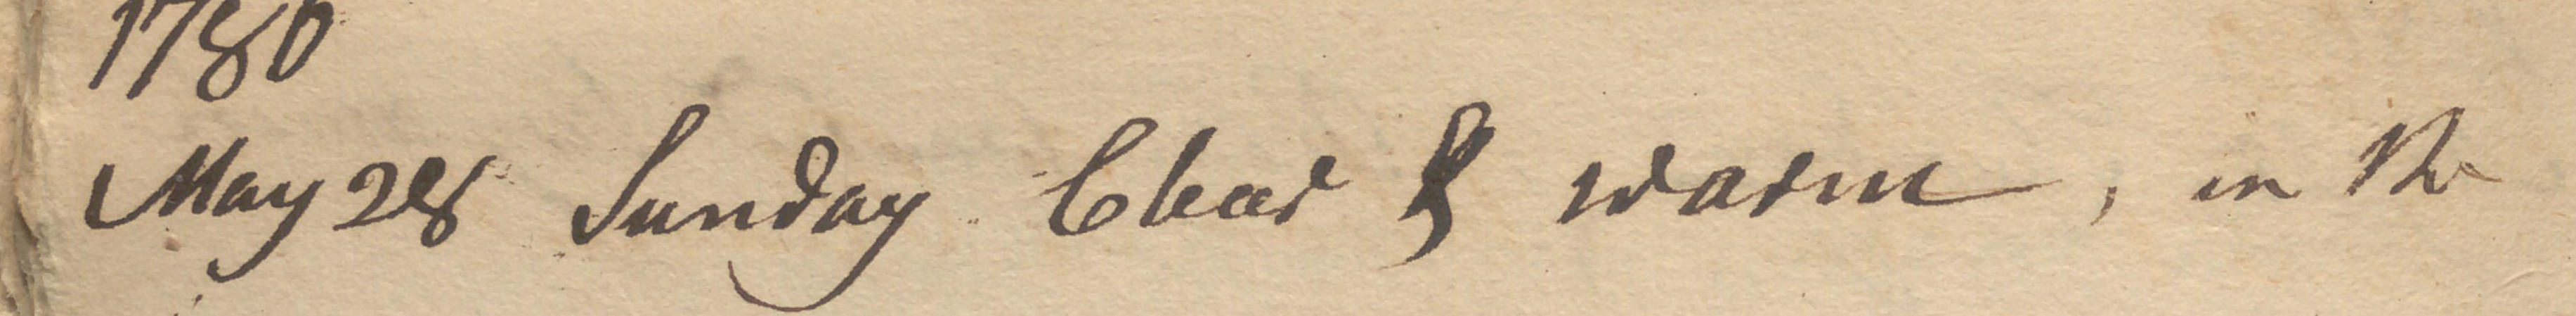May 28^h Sunday Clear & warm, in the
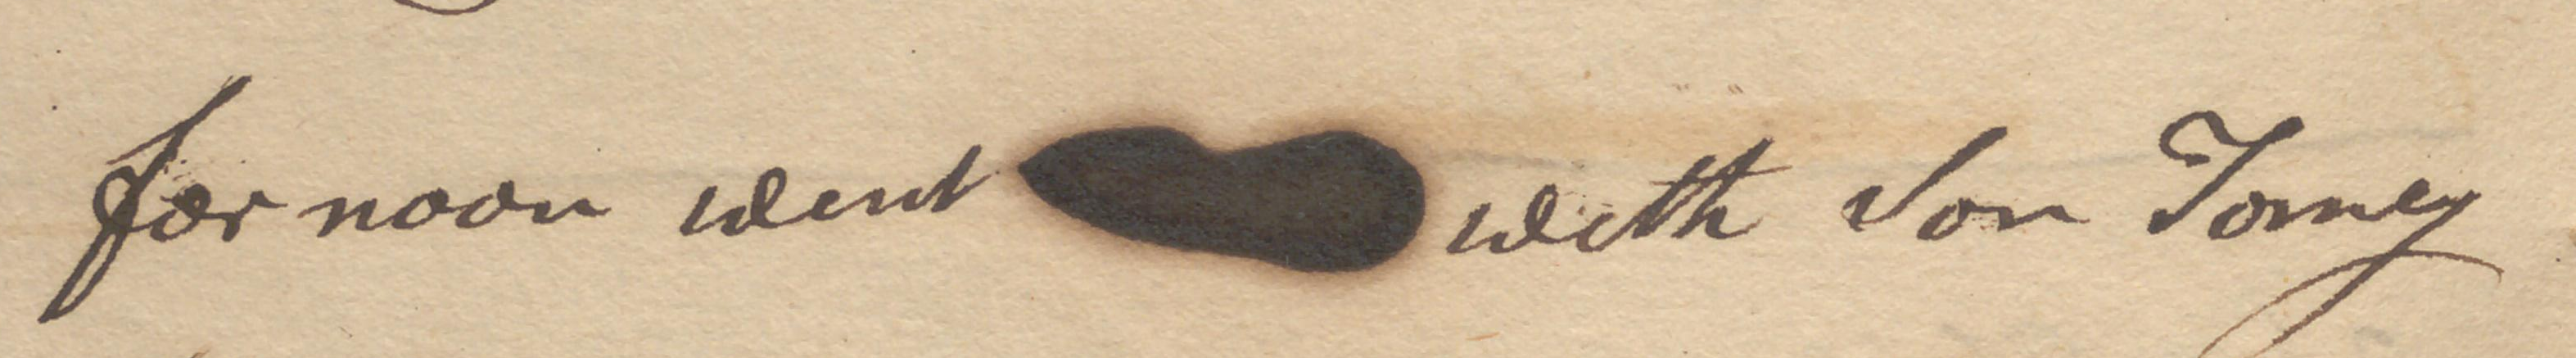for noon went with Son Tomey
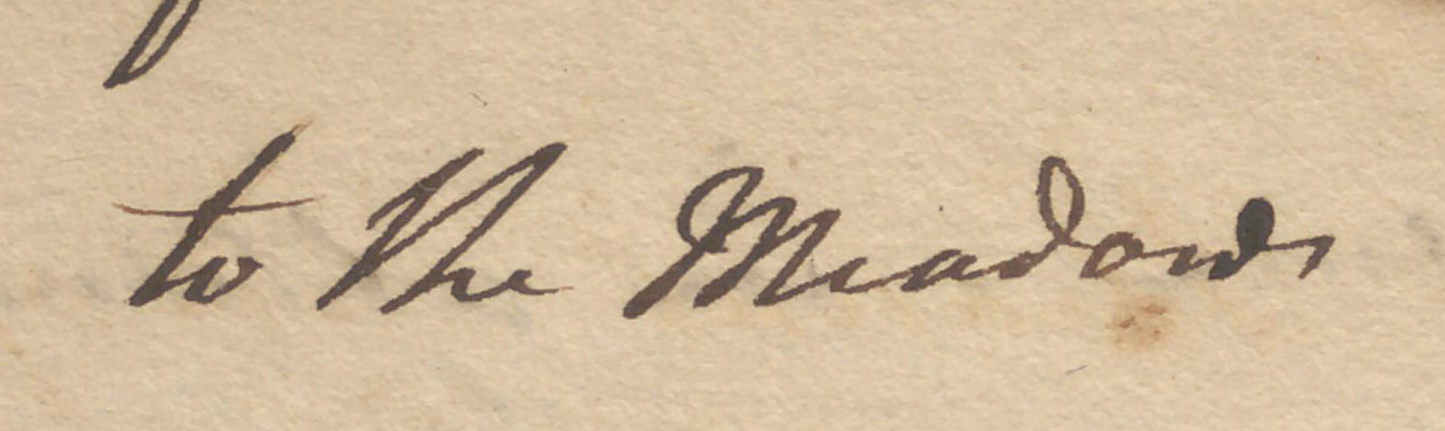to the Meadows
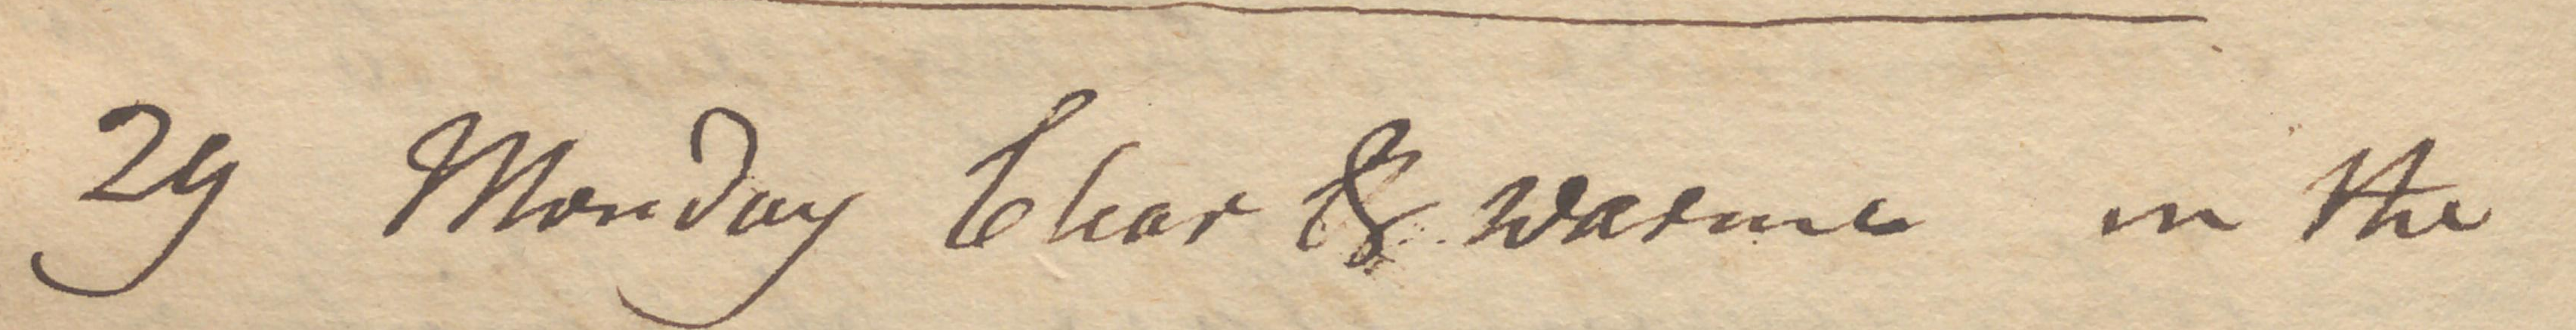29 Monday Clear & warme, in the
